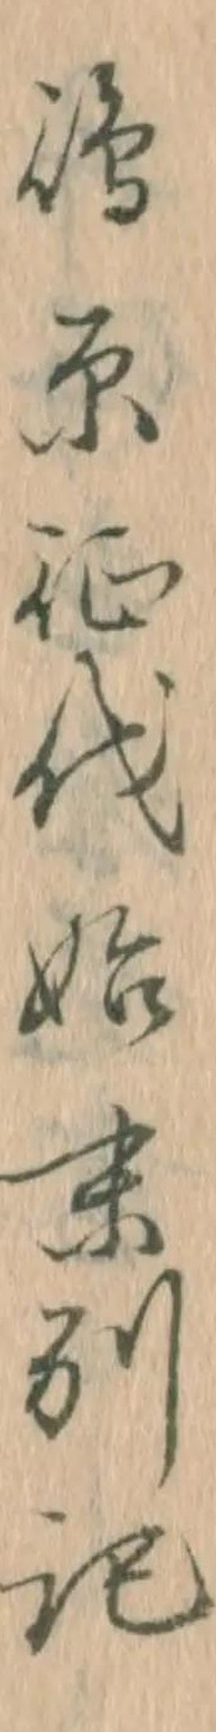島原征伐始末別記
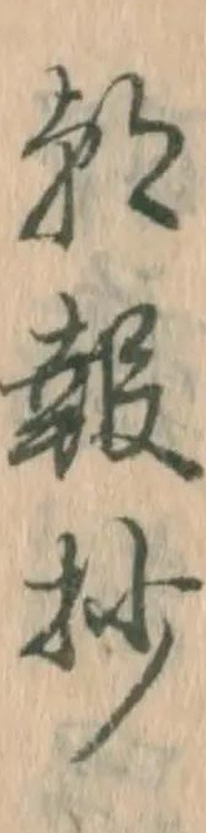朝報抄
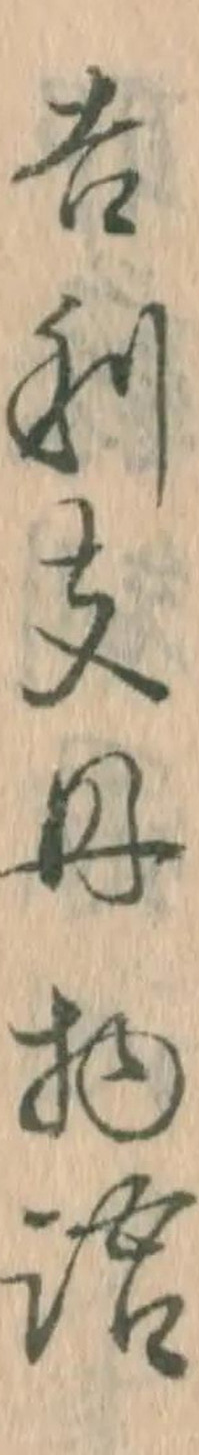吉利支丹物語
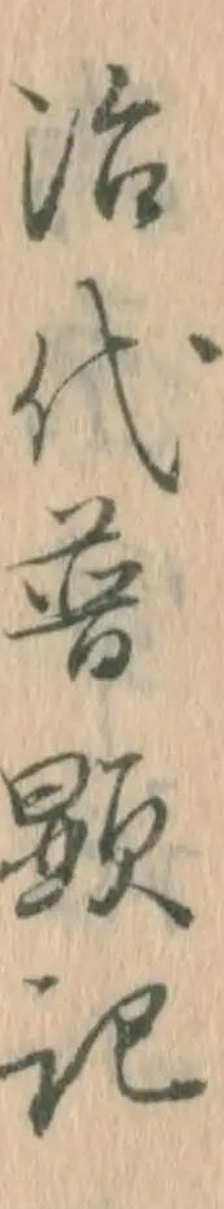治代普顕記
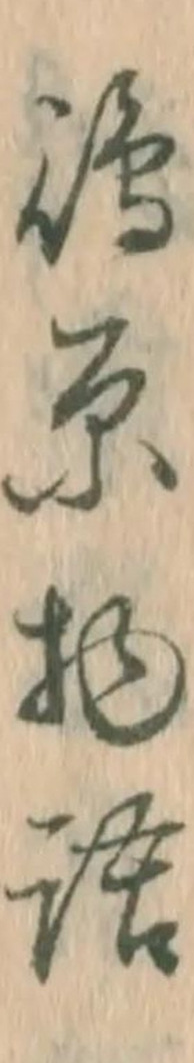島原物語
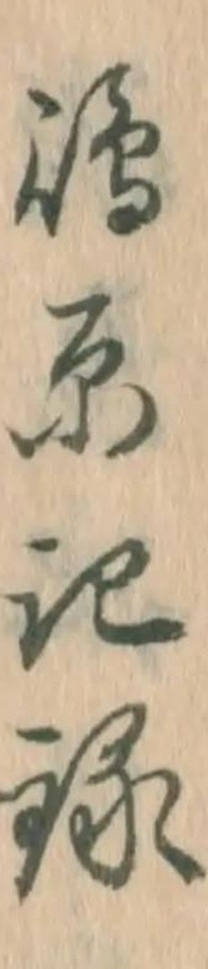島原記録

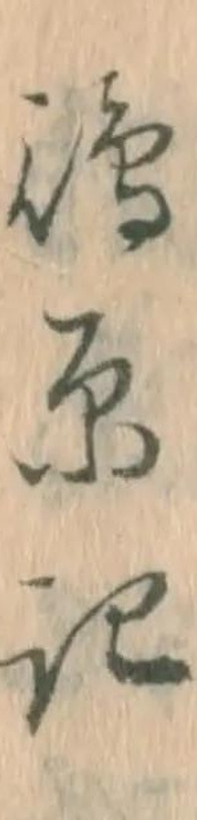島原記
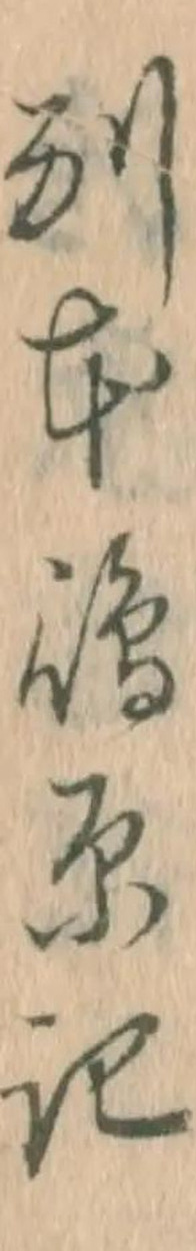別本島原記
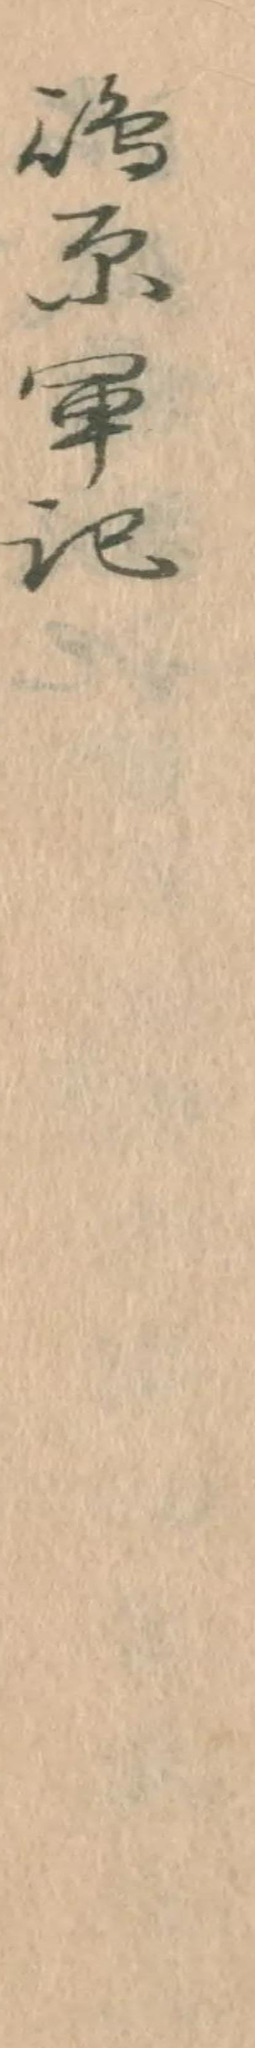島原軍記
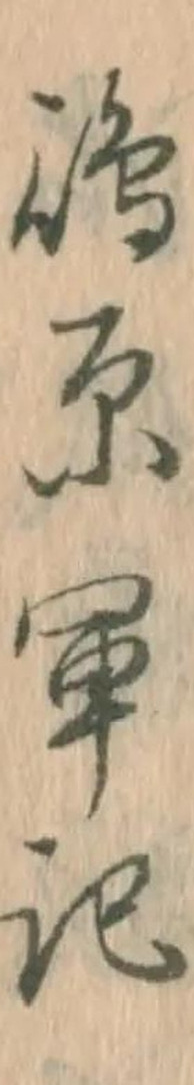島原軍記
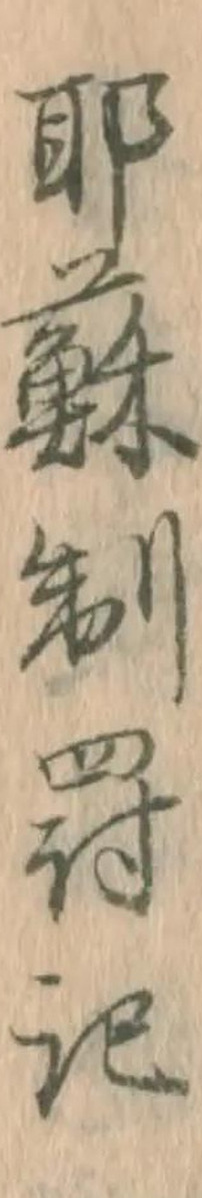耶蘇制罰記
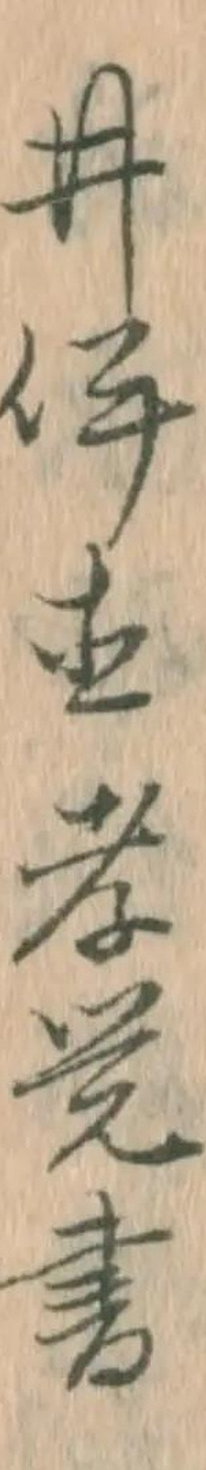井伊直孝覚書
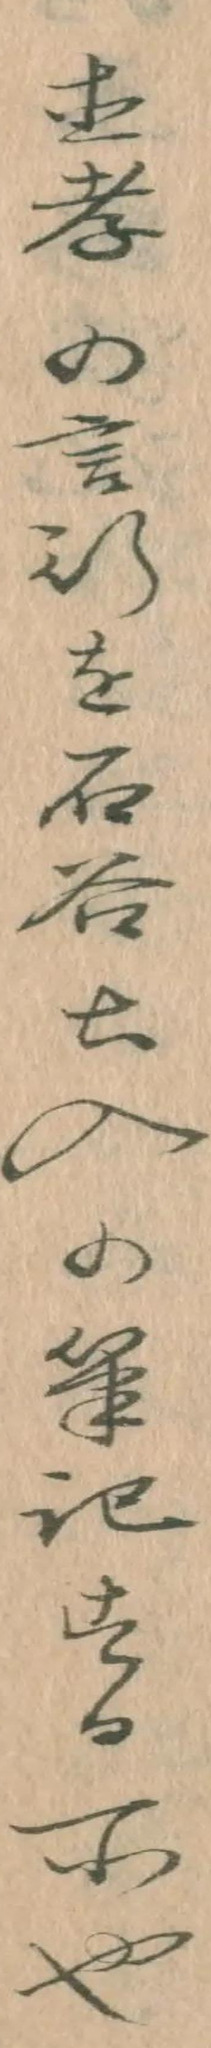直孝の言行を石谷土入の筆記する所也
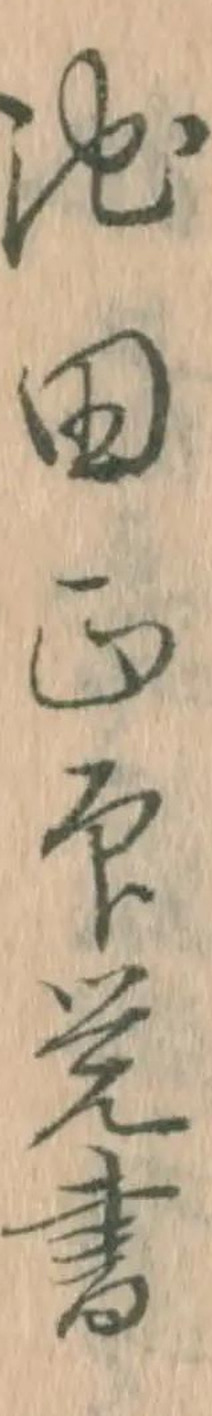池田正印覚書
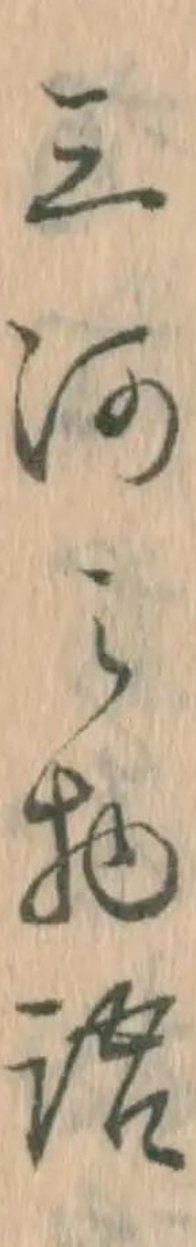三河之物語
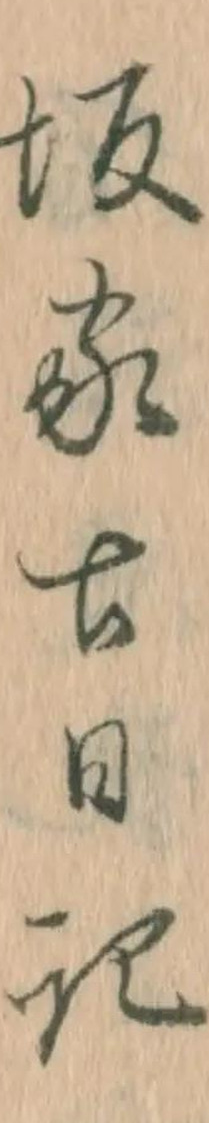坂家古日記
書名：切支丹御退治記 49巻. [1]
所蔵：国立国会図書館 National Diet Library, JAPAN
